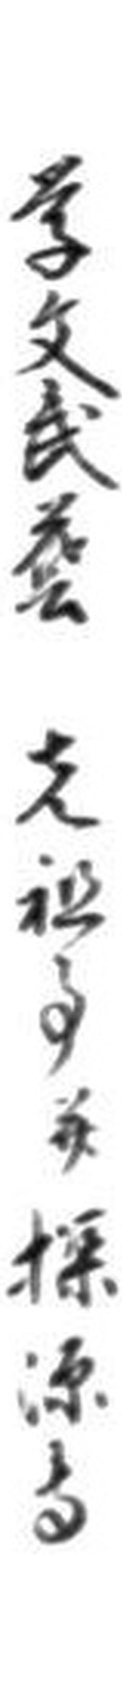学文武芸先祖事并操錬等
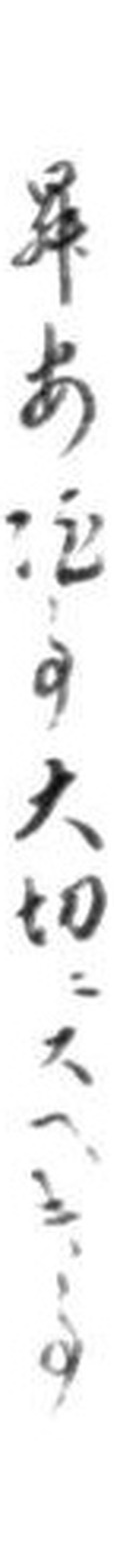昇安院事大切ニスヘキ事
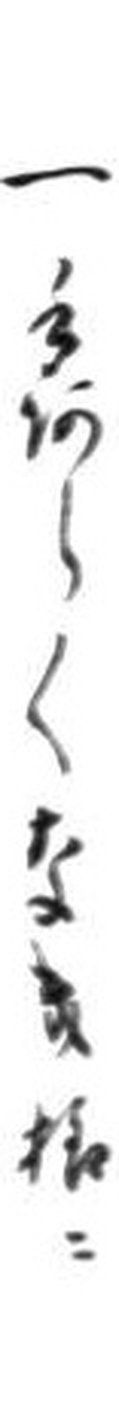一手あらくなき様ニ
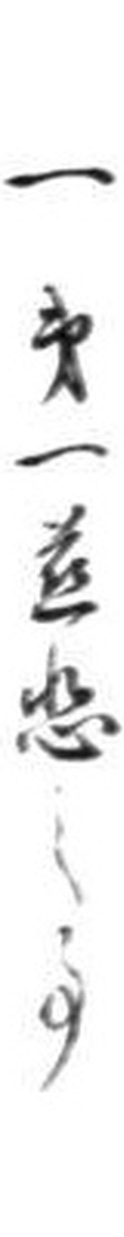一第一慈悲之事

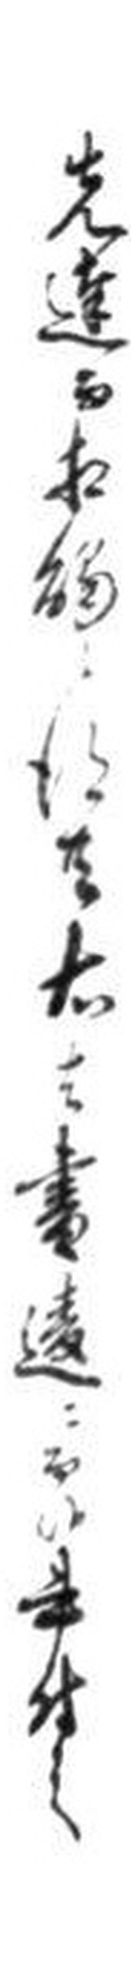先達而相触候得共右者書違ニ而候書付之
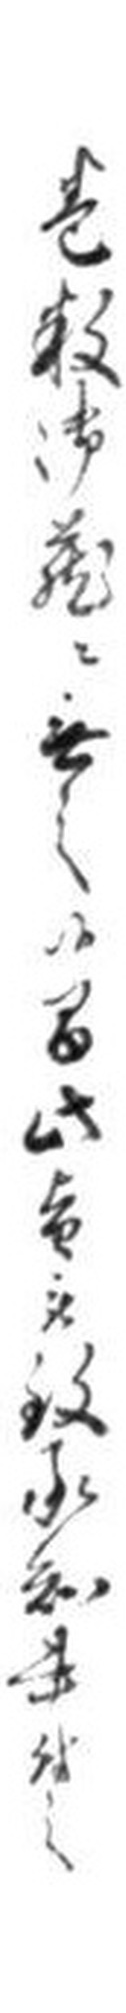巻数御蔵ニ無之候間此旨被致承知書付之
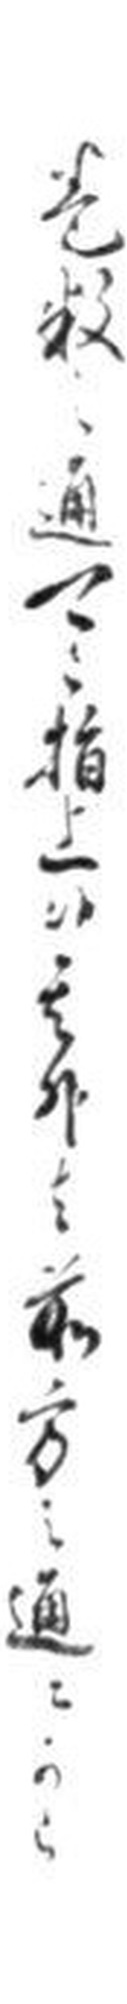巻数之通可被指上候其外者前方之通ニ可被
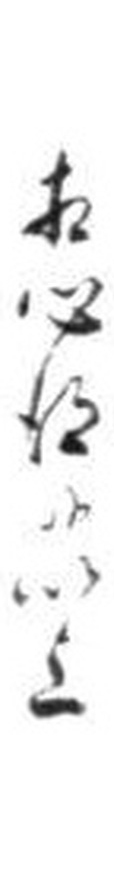相心得候以上
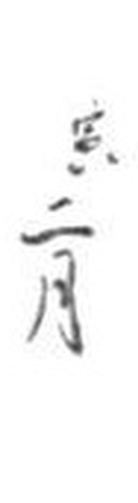寅二月
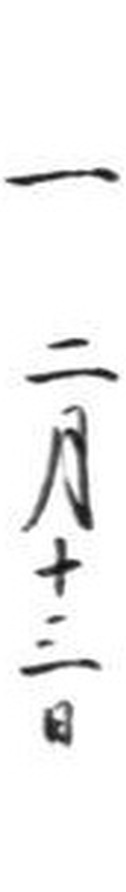一二月十三日
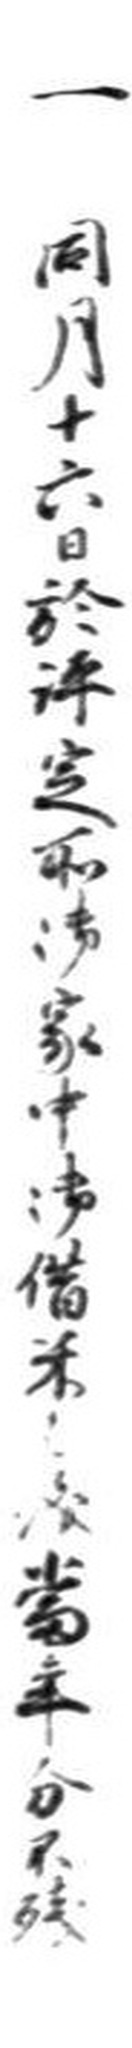一同月十六日於評定所御家中御借米之儀当年分不残
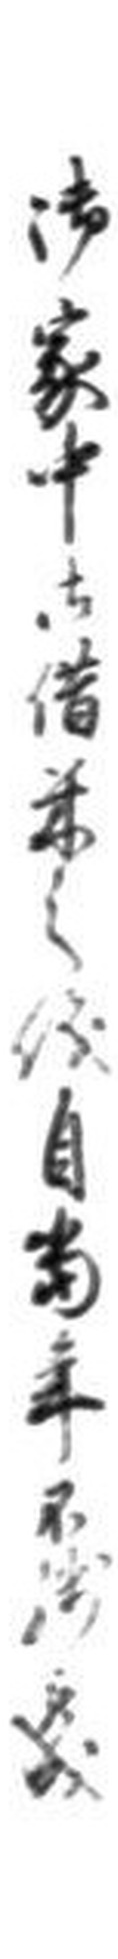御家中御借米之儀自当年不残被成
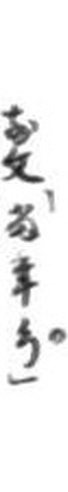前文「当年乃」
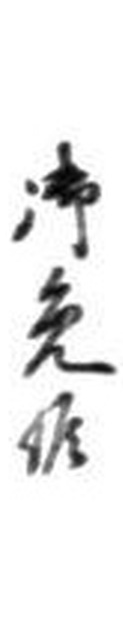御免候
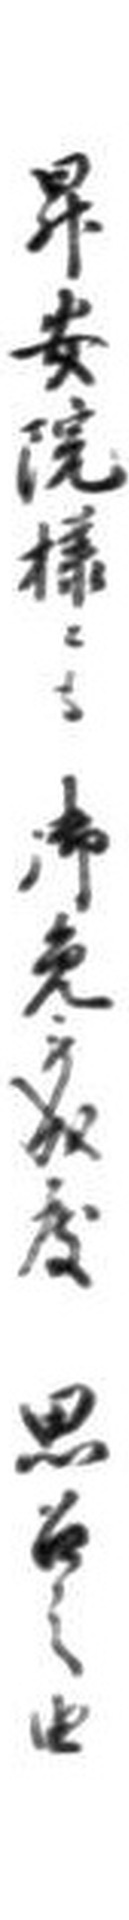昇安院様ニも御免被成度思召之由
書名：家譜 三十五 宗昌公 従享保六年到同七年
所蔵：福井県文書館 Fukui Prefectural Archives
